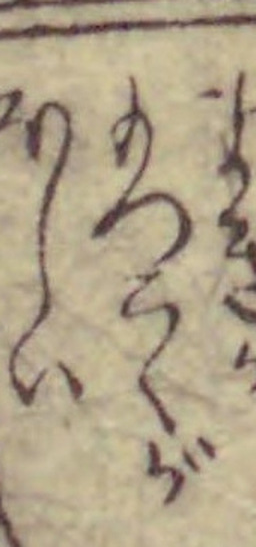ほしい
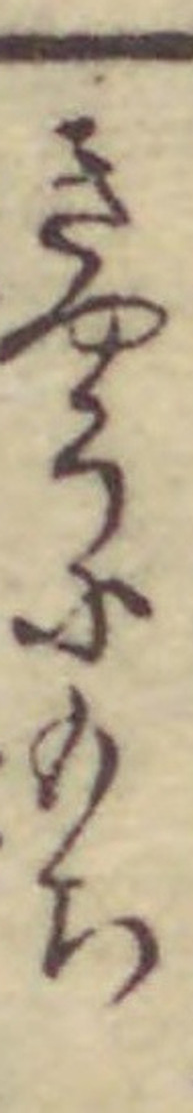きやうにもち
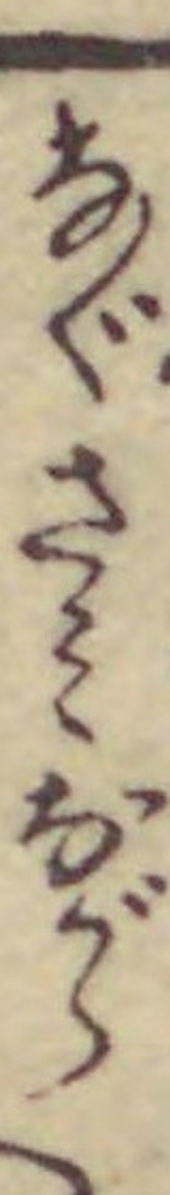なぐさみながら
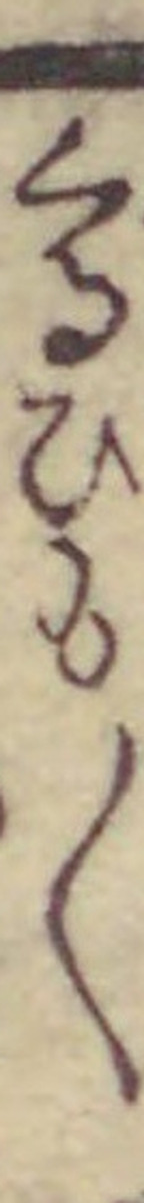くるひも〳〵
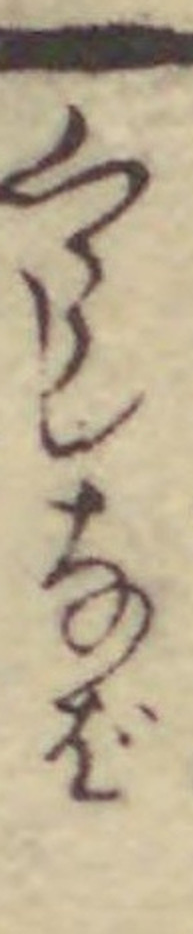くらしなば
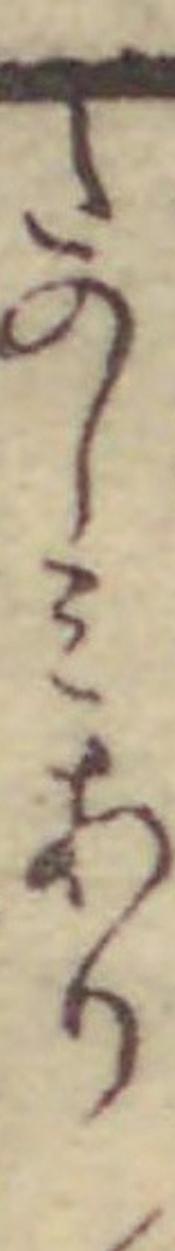たのしみあり
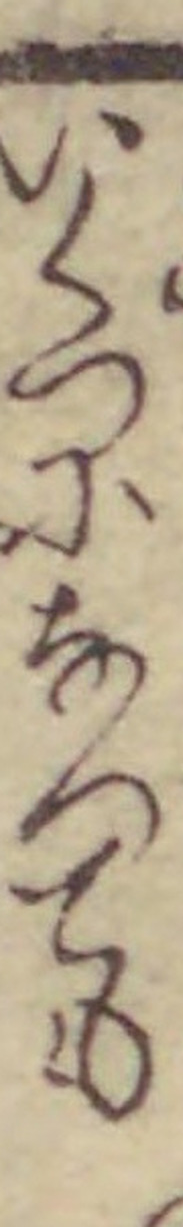いくつになつても
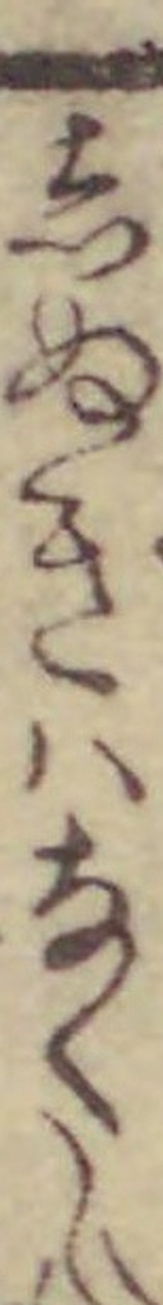しぬきはなく
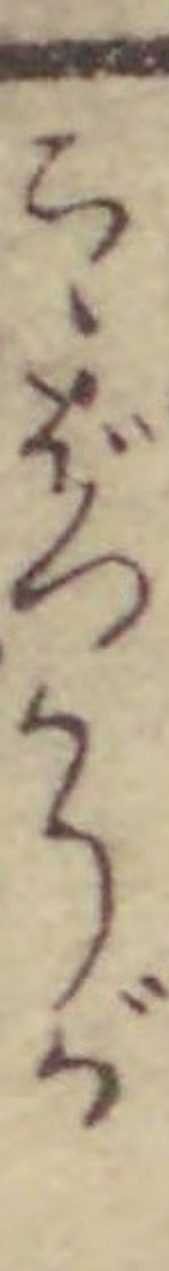こゝばつかりが
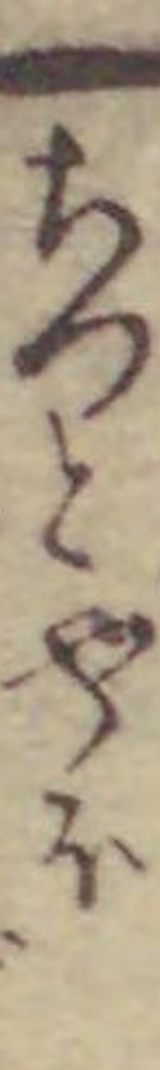ちつとやほ
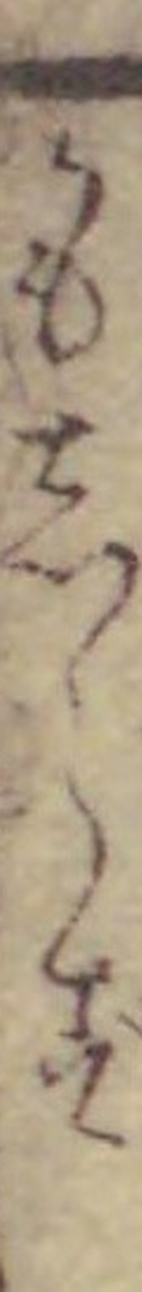かもしらず

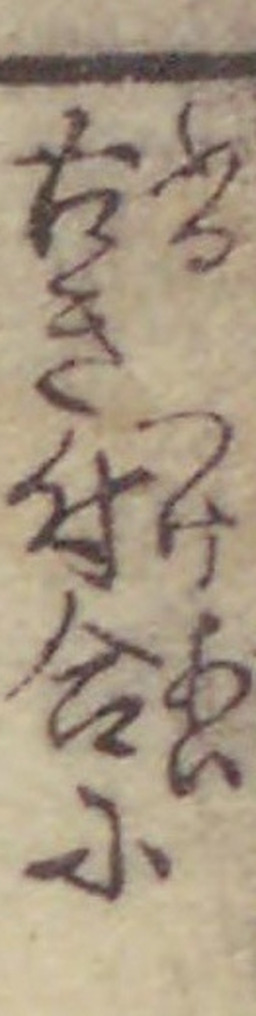古き付合に
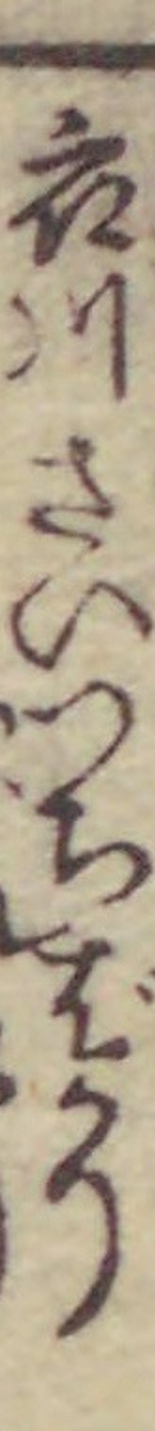衣川さいづちばかり
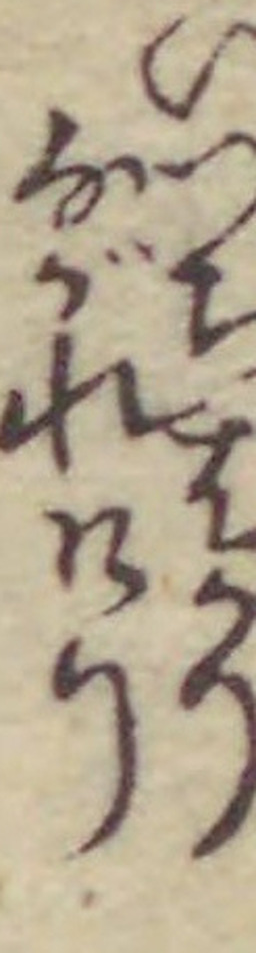ながれけり
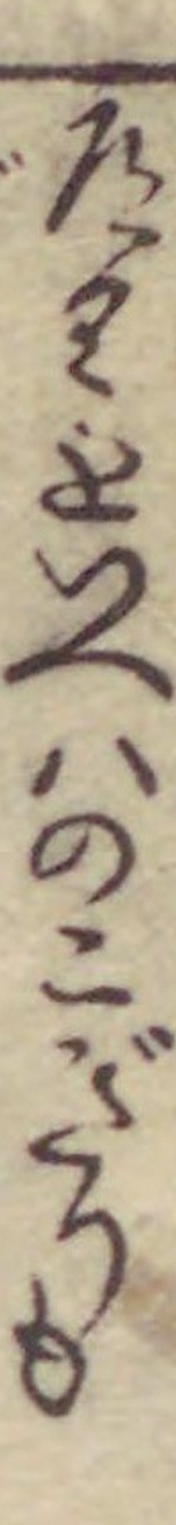道具といへはのこぎりも
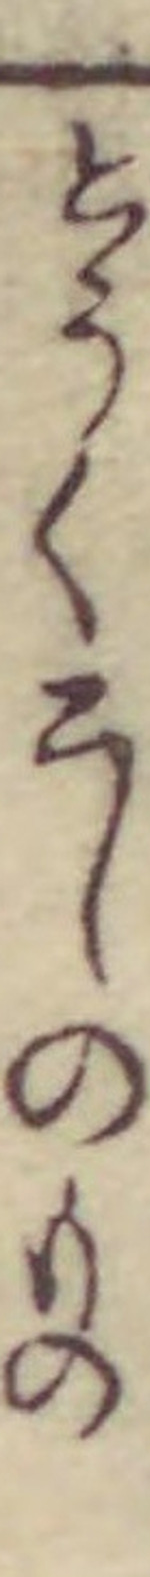どうくこしのもの
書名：大通人穴[サガシ] 3巻
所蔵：国立国会図書館 National Diet Library, JAPAN
